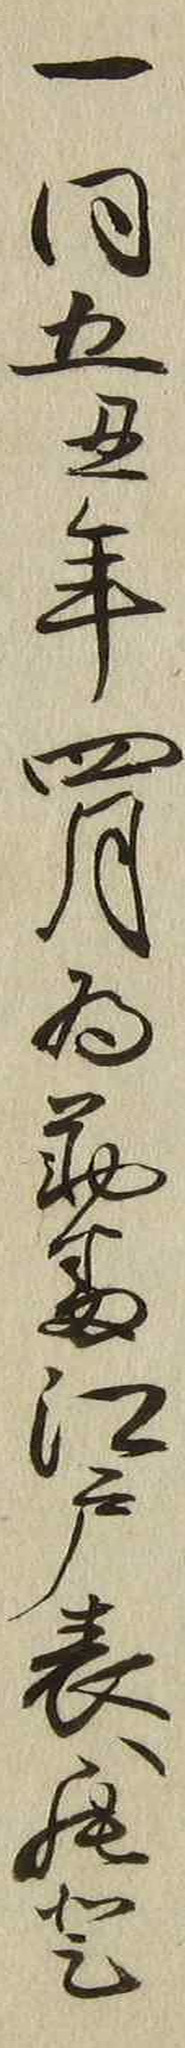一同五丑年四月為勤番江戸表へ罷登
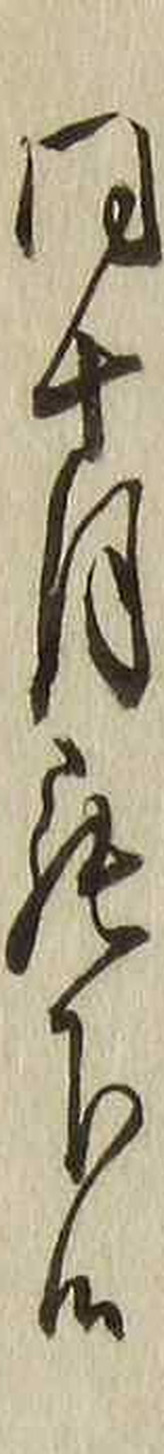同十月罷下候
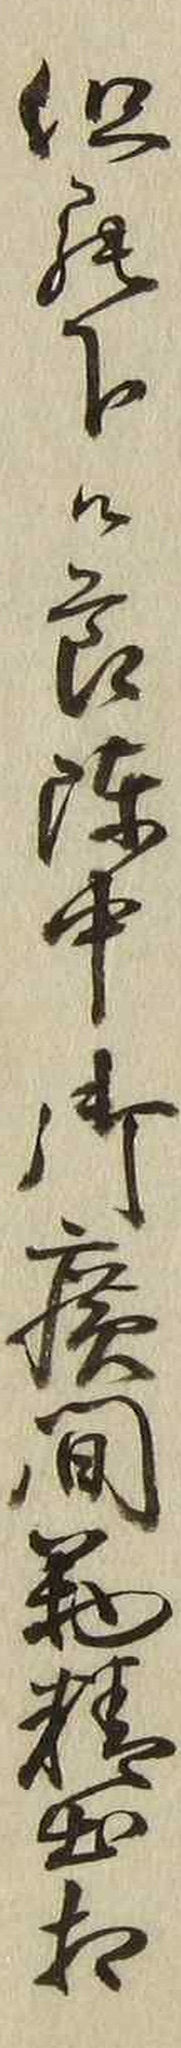但罷下候節陣中御広間勤精出相
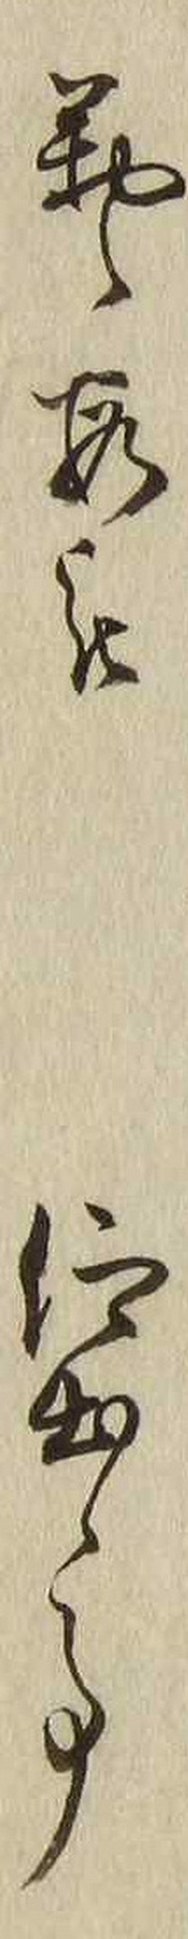勤候段被仰出候事
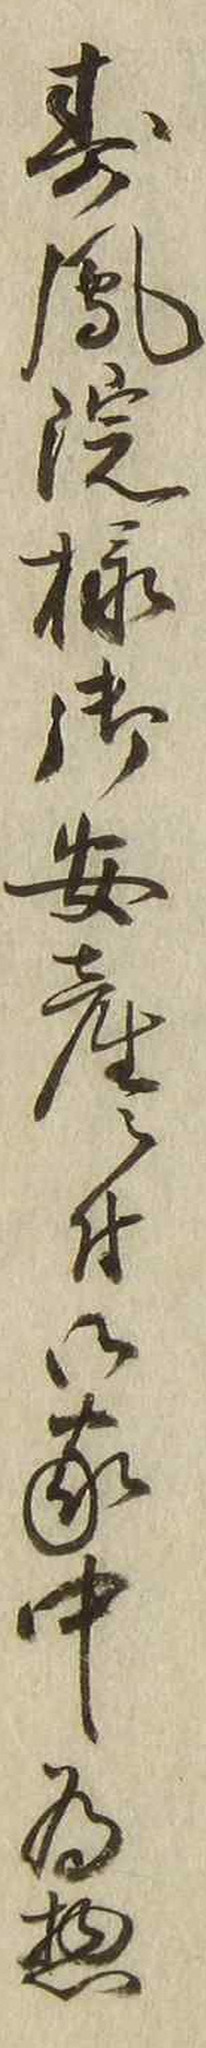寿鳳院様御安産ニ付御家中為惣

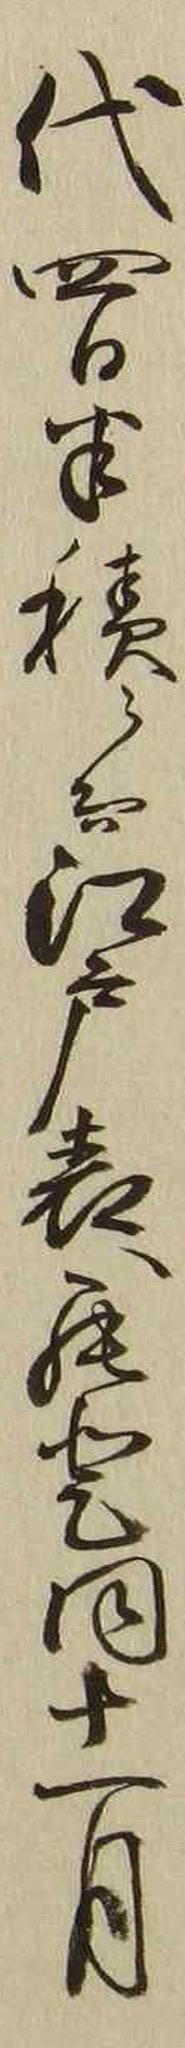代四日半積ニ而江戸表へ罷登同十一月
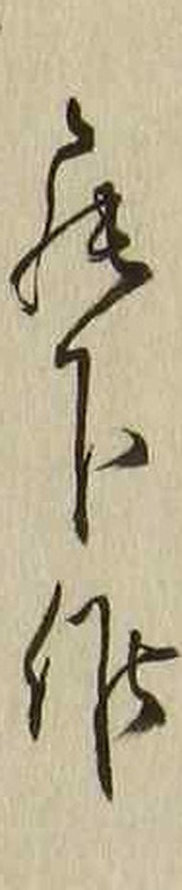罷下候
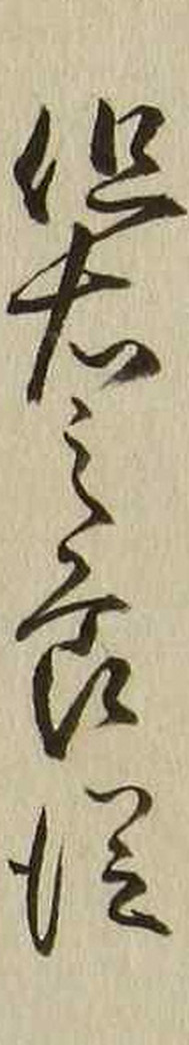但右之節従
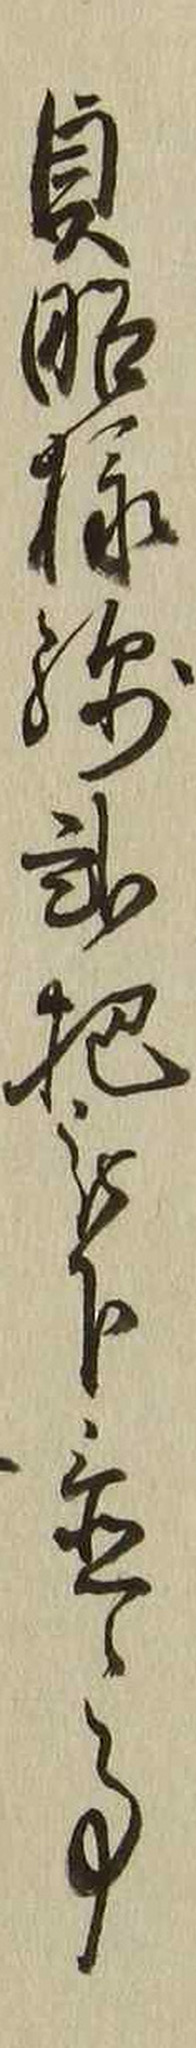貞昭様綿弐把被下置候事
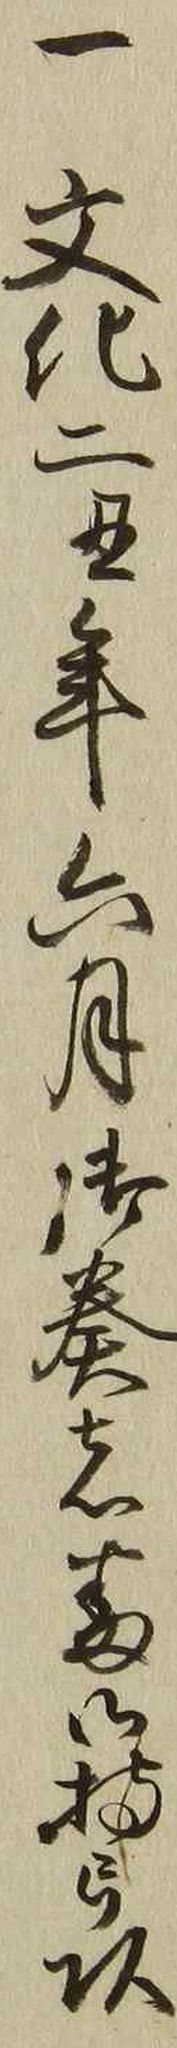一文化二丑年六月御奏者番御持弓頭
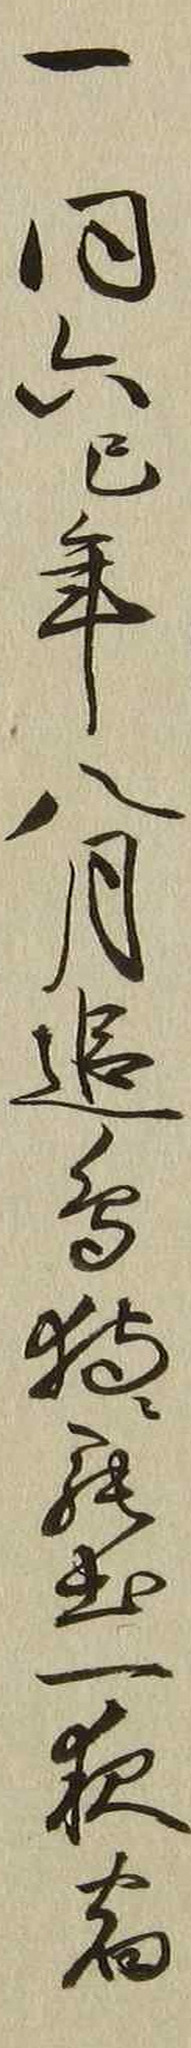一同六巳年八月追鳥狩ニ罷出一夜宿
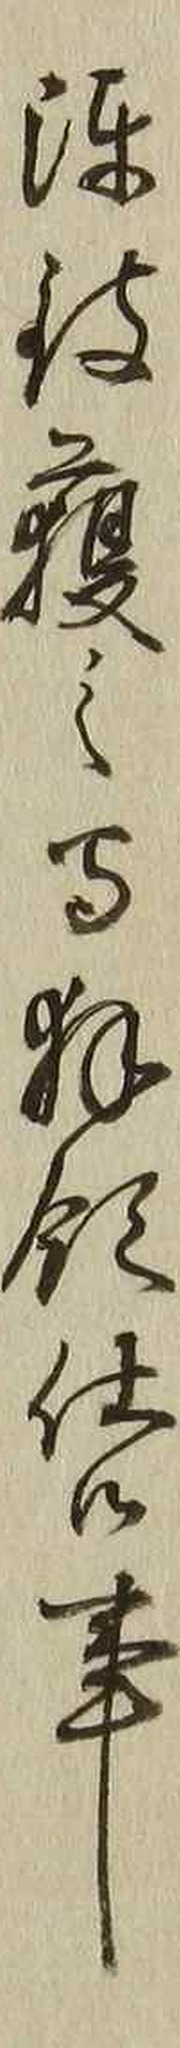陣致獲之鳥拝領仕候事
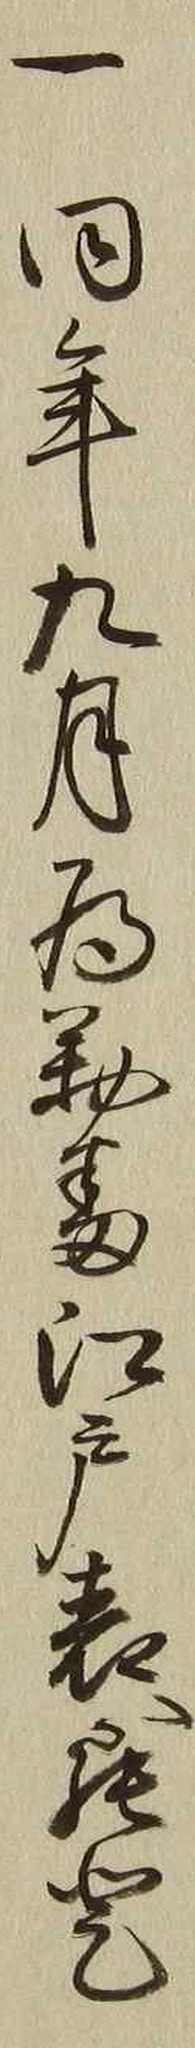一同年九月為勤番江戸表へ罷登
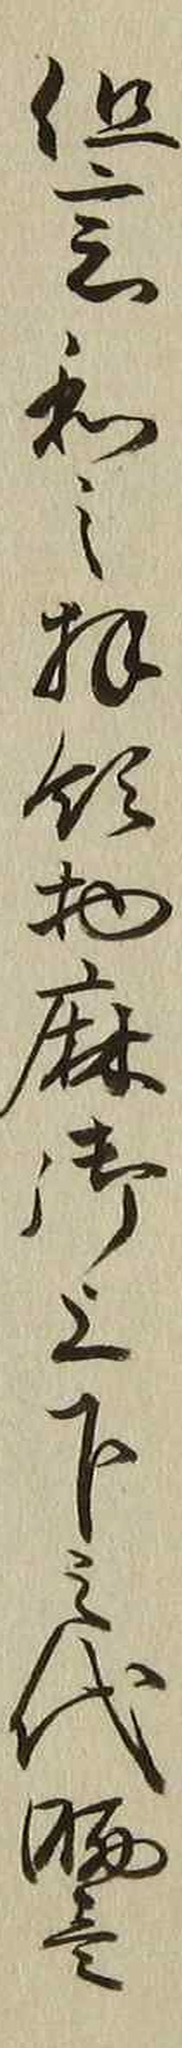但定和之拝領物麻御上下之代晒壱
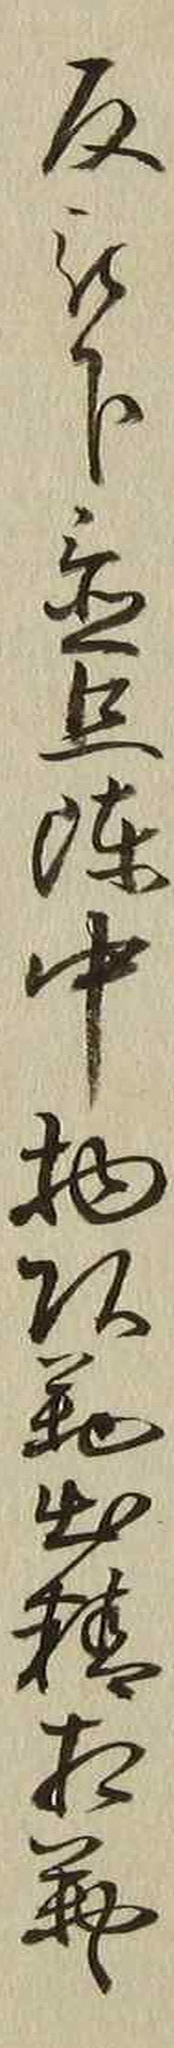反被下置且陣中物頭勤出精相勤候
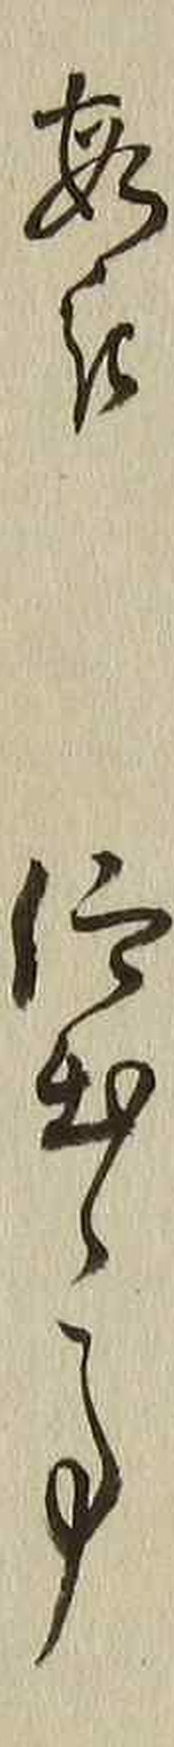段被仰出候事
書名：諸士系譜　巻之60　と之部3
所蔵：会津若松市立会津図書館
